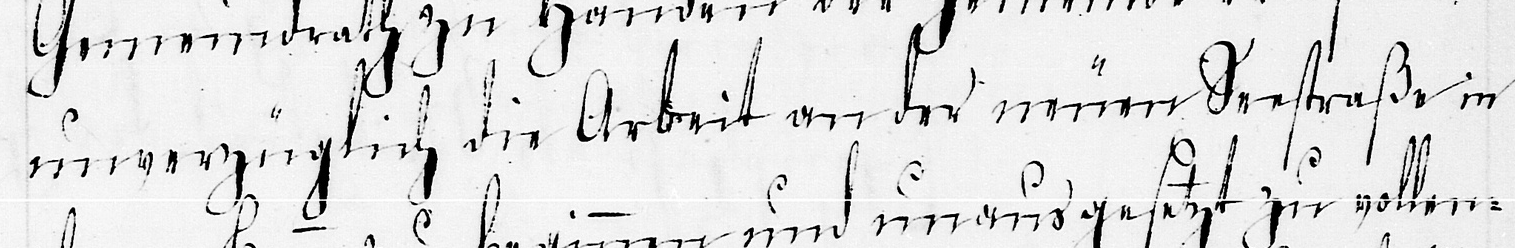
unverzüglich die Arbeit an der neuen Seestraße in
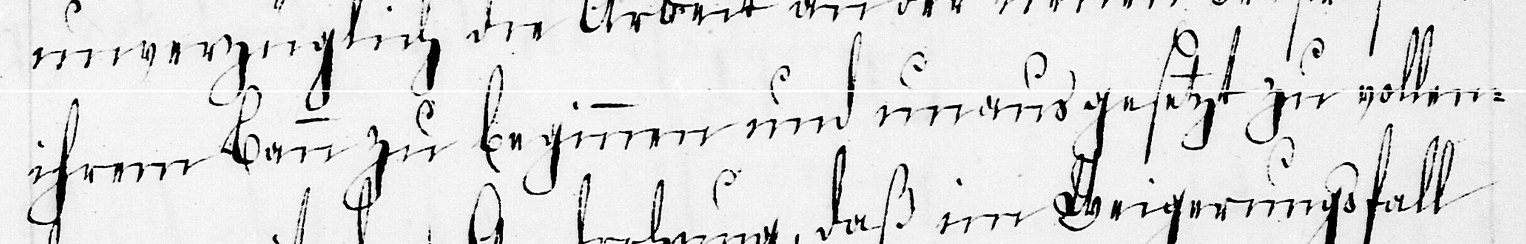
ihrem Bau zu beginnen und unausgesetzt zu vollen¬
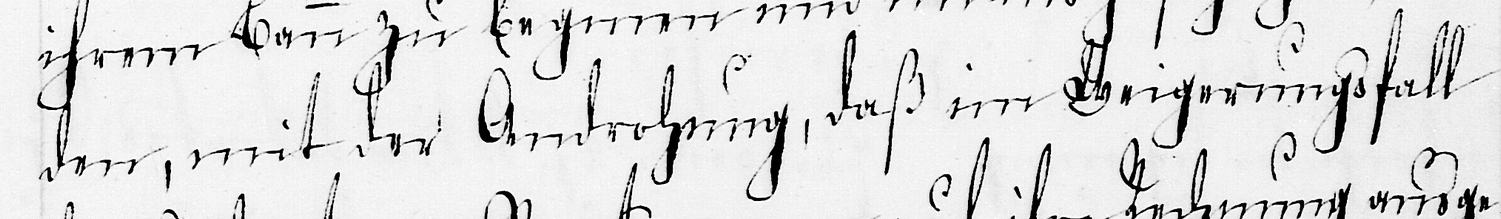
den, mit der Androhung, daß im Weigerungsfall
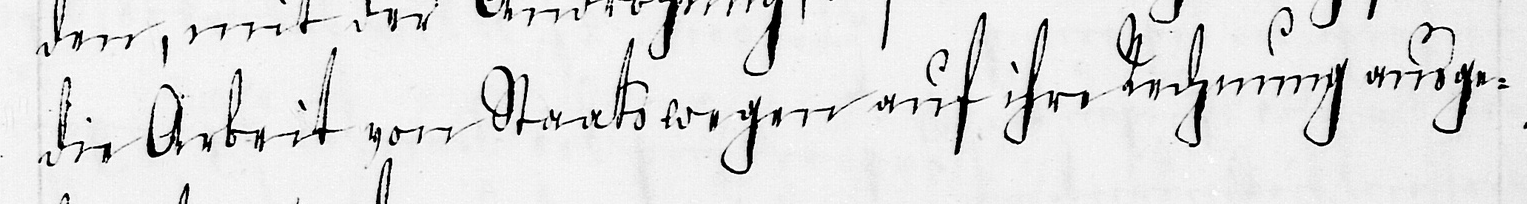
die Arbeit von Staatswegen auf ihre Rechnung ausge¬
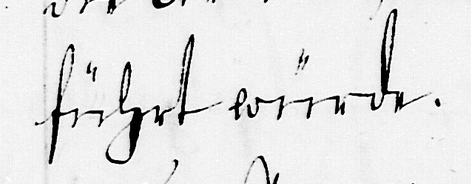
führt würde.
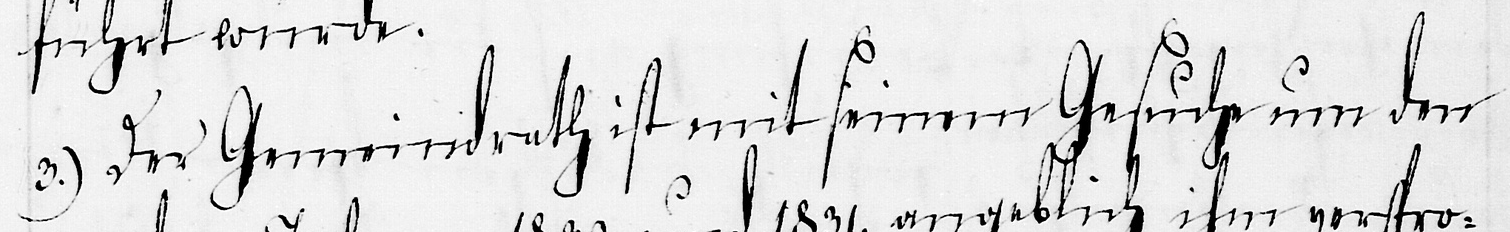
3.) Der Gemeindrath ist mit seinem Gesuche um den
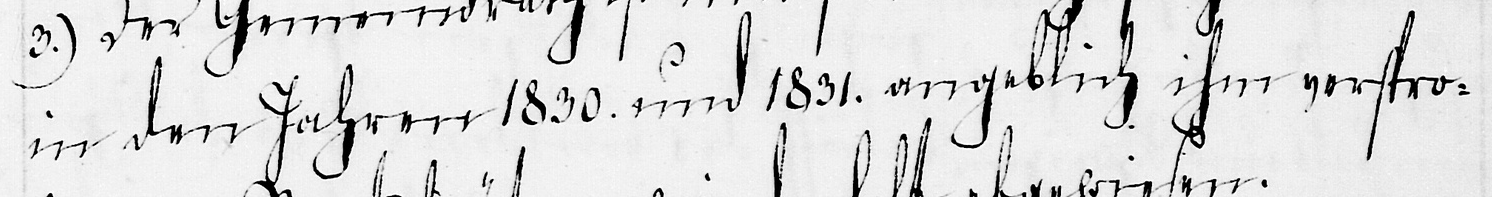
in den Jahren 1830. und 1831. angeblich ihm verspro¬
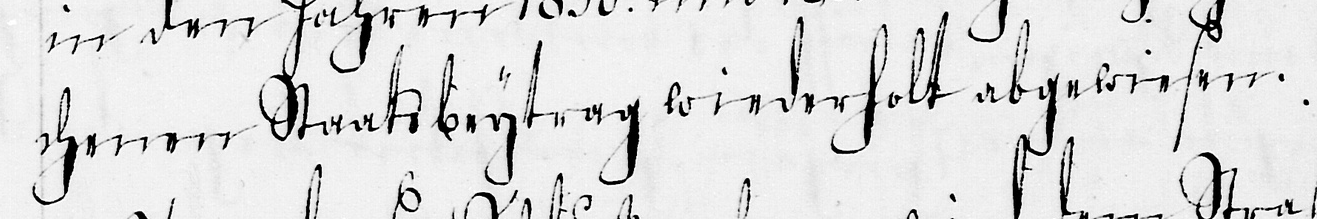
chenen Staatsbeytrag wiederholt abgewiesen.
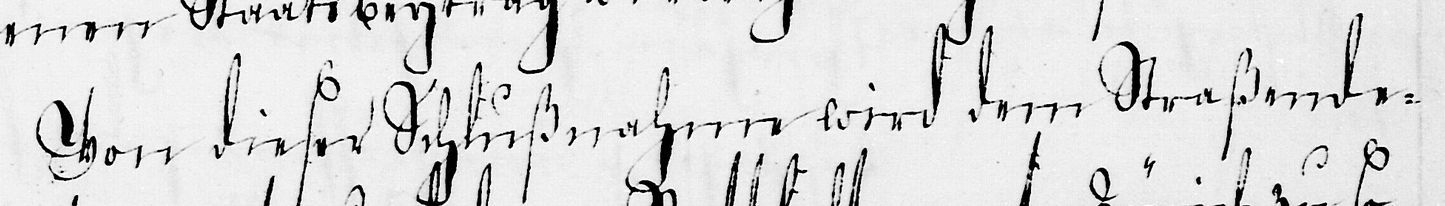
Von dieser Schlußnahme wird dem Straßende¬
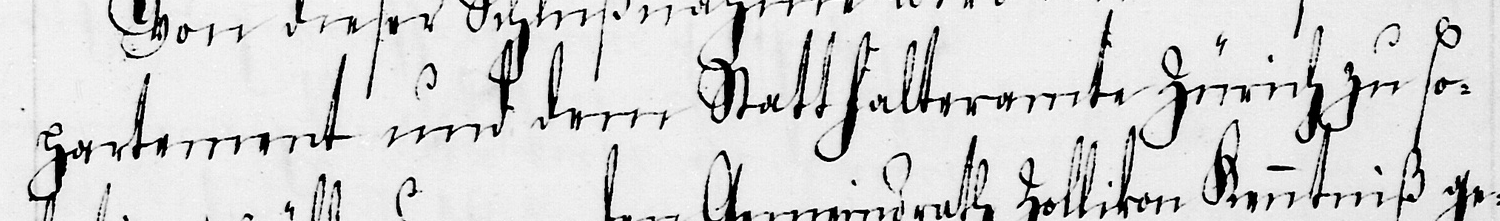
partement und dem Statthalteramte Zürich zu so¬
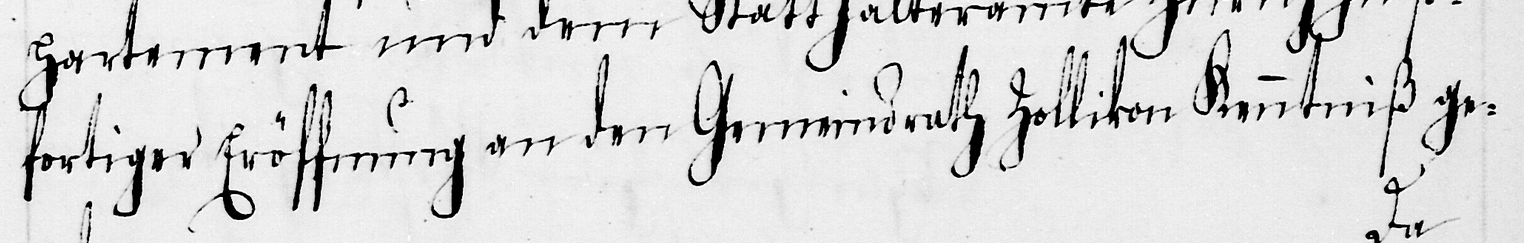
fortiger Eröffnung an den Gemeindrath Zollikon Kenntniß ge¬
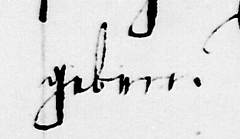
geben.
